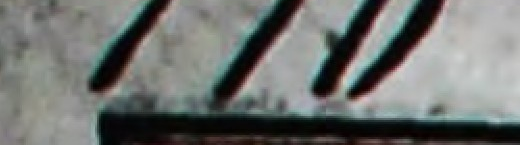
770
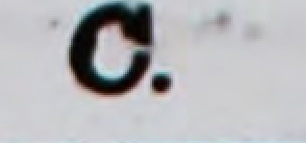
C.
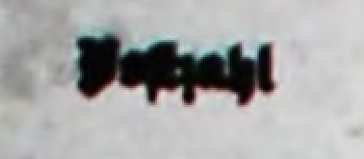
Postzahl
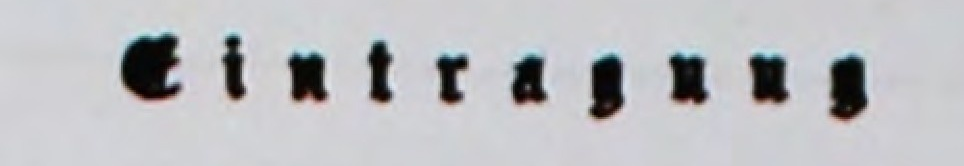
Eintragung
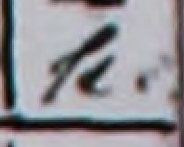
h.
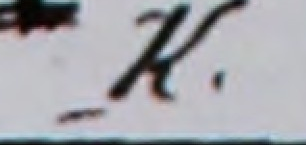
K.
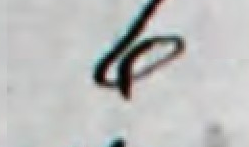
6
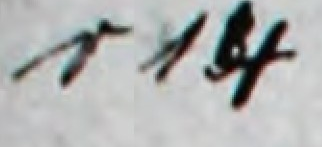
s 14
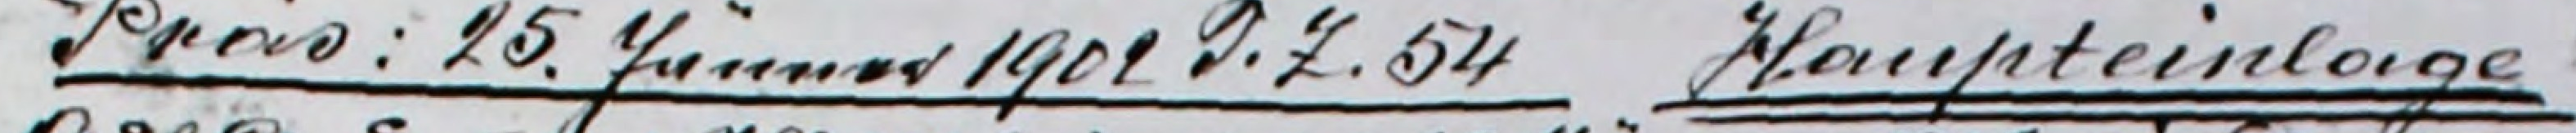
Präs: 25. Jänner 1902 T.Z. 54 Haupteinlage
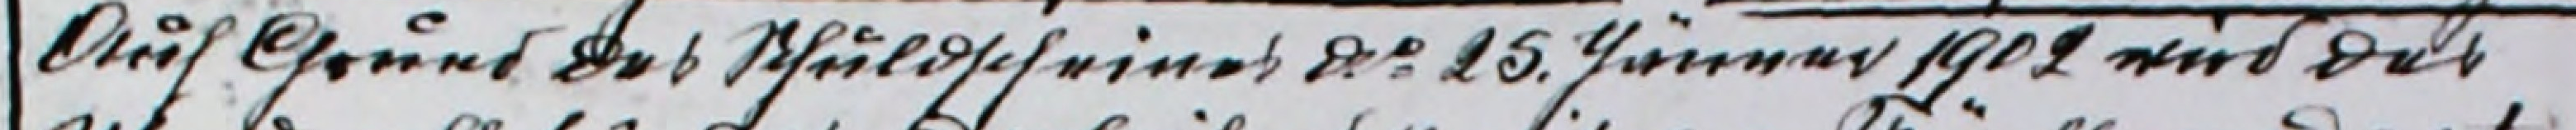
Auf Grund des Schuldscheines ddo 25. Jänner 1902 wird das
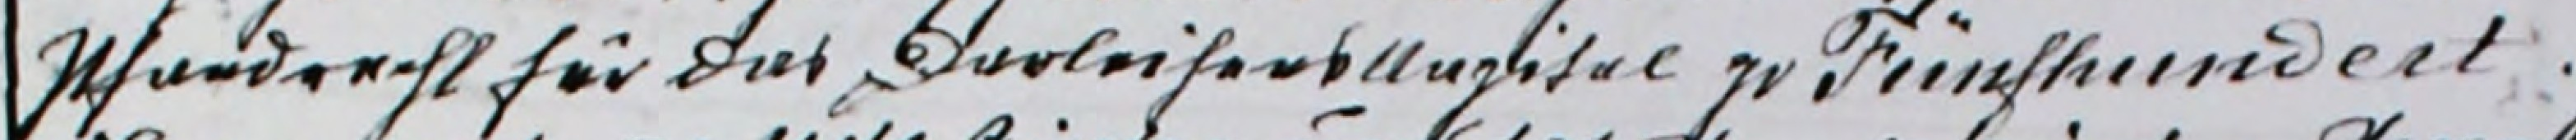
Pfandrecht für das Darleihenskapital pr Fünfhundert
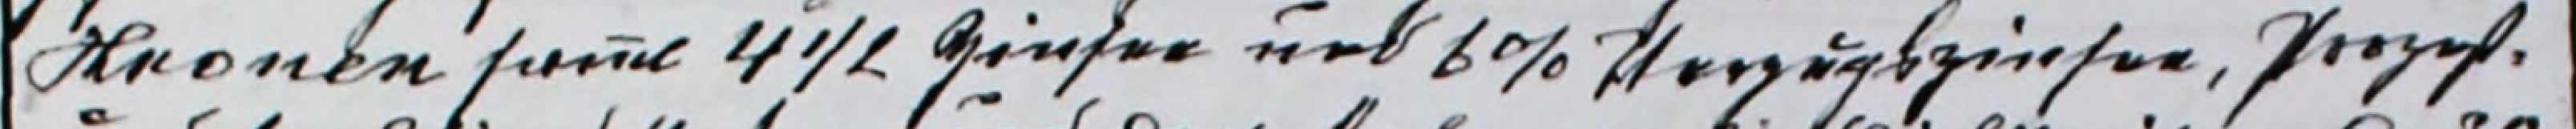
Kronen sammt 4 1/2 Zinsen und 6 % Verzugszinsen, Prozest=
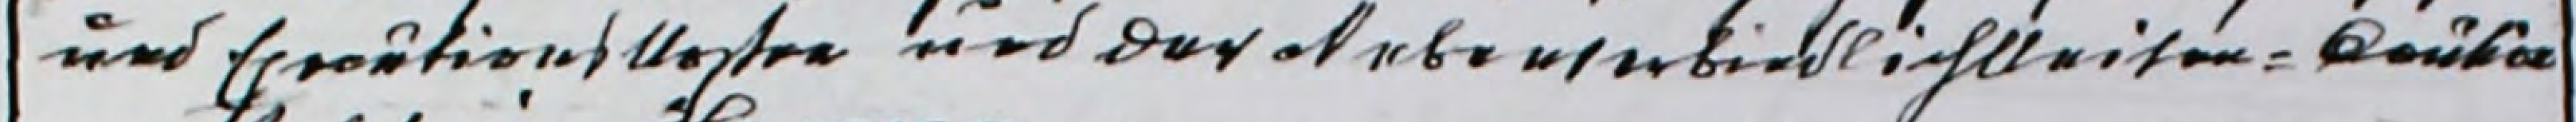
und Executionskasten und der Nebenverbindlichkeiten = Caution
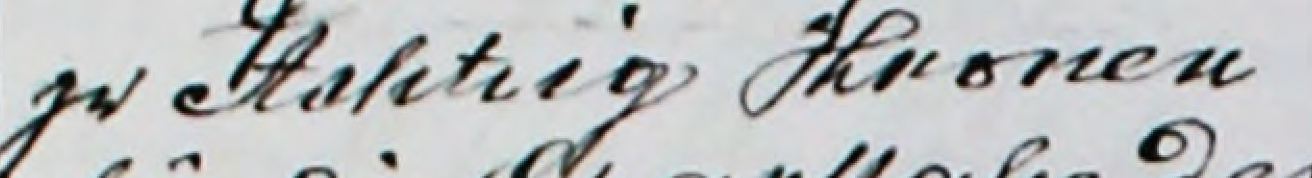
pr Achtzig Kronen
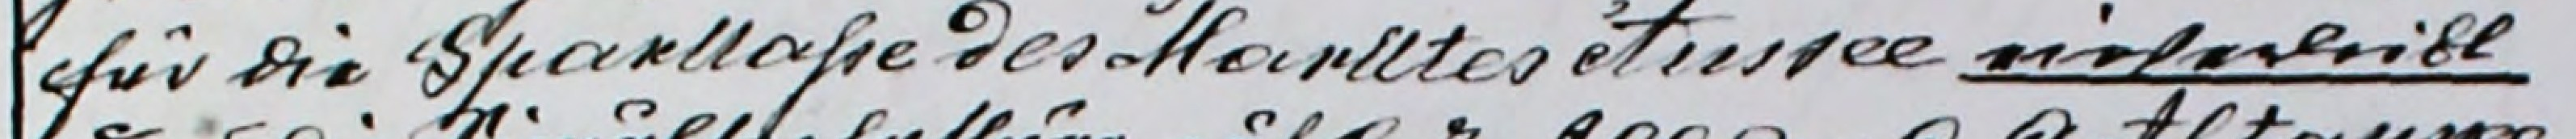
für die Sparkasse des Marktes Aussee einverleibt
